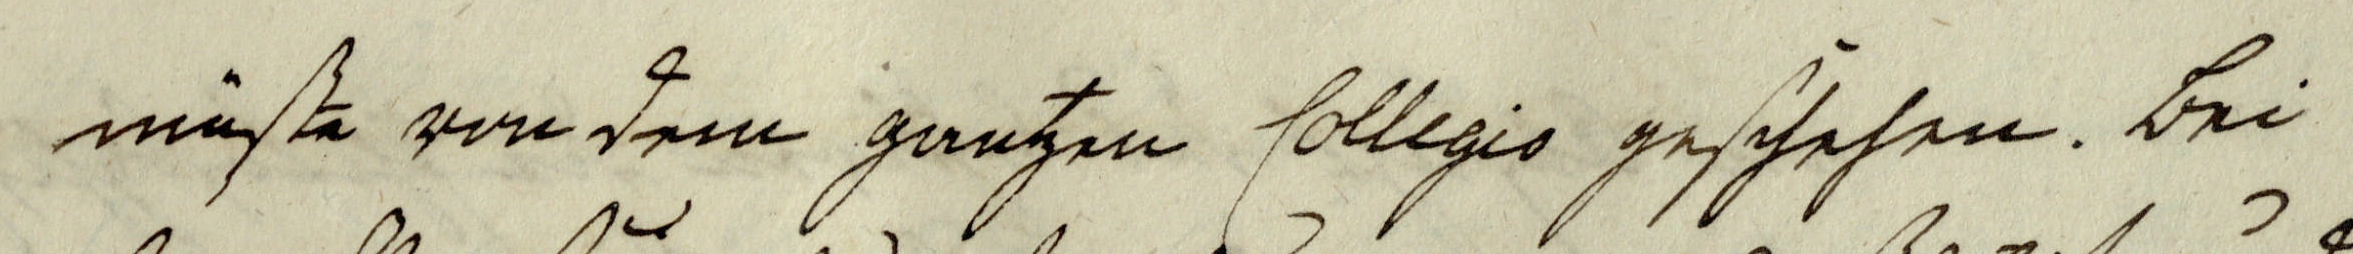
müsste von dem gantzen Collegio geschehen. Bei
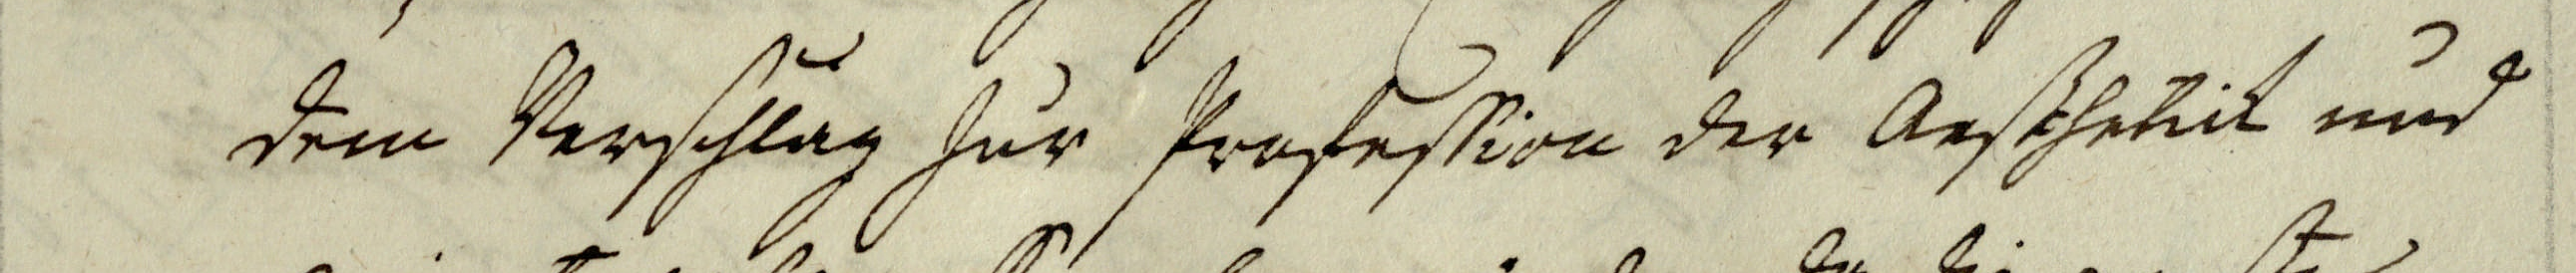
dem Vorschlag zur Profession der Aesthetik und
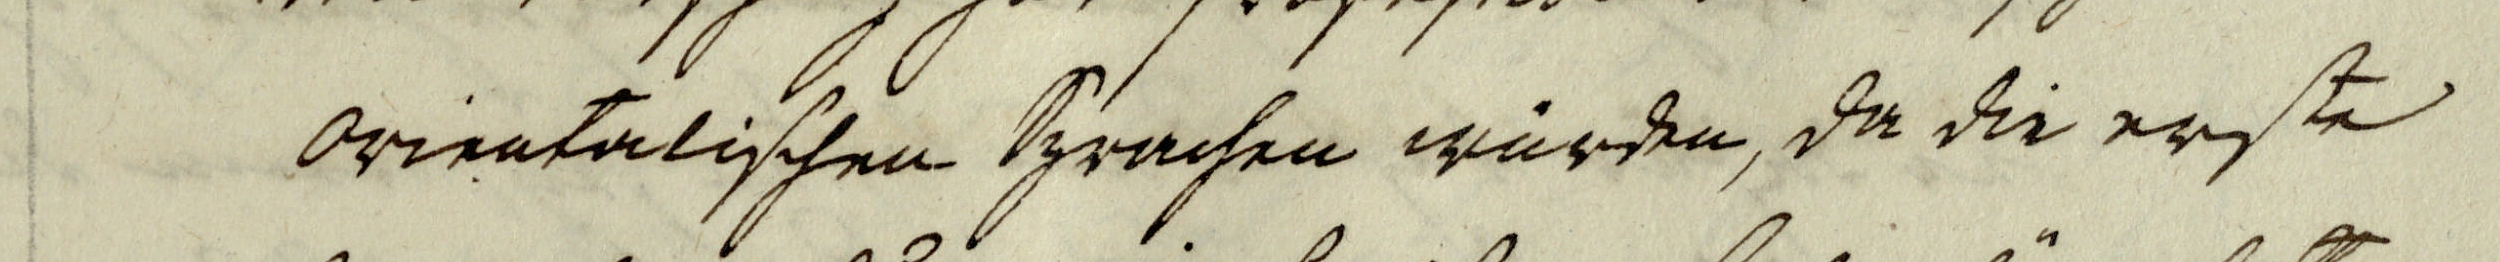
orientalischen Sprachen würden, da die erste
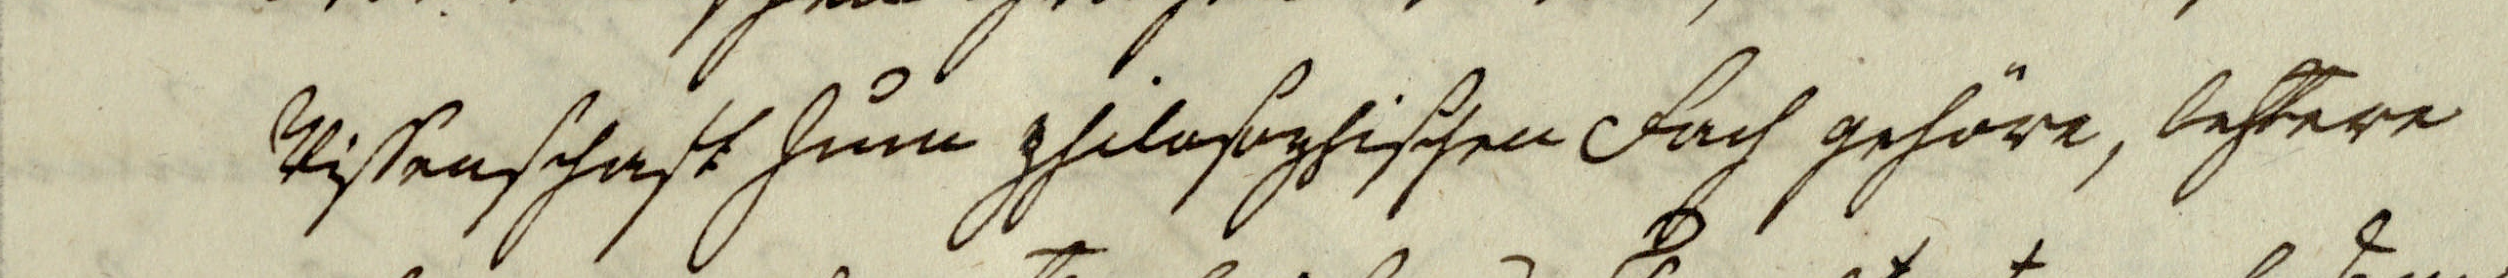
Wissenschaft zum philosophischen fach gehöre, letztere
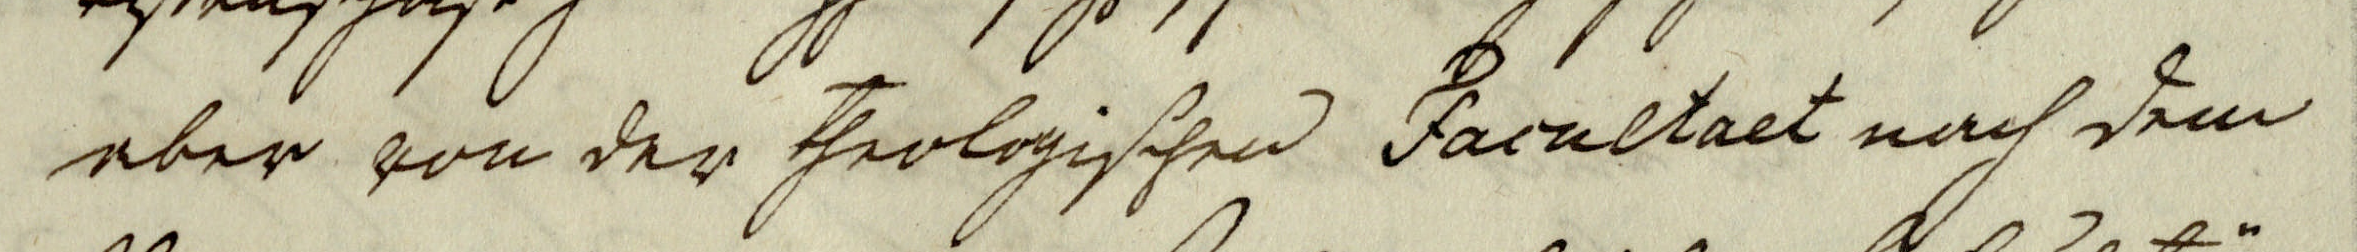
aber von der theologischen Facultaet nach dem
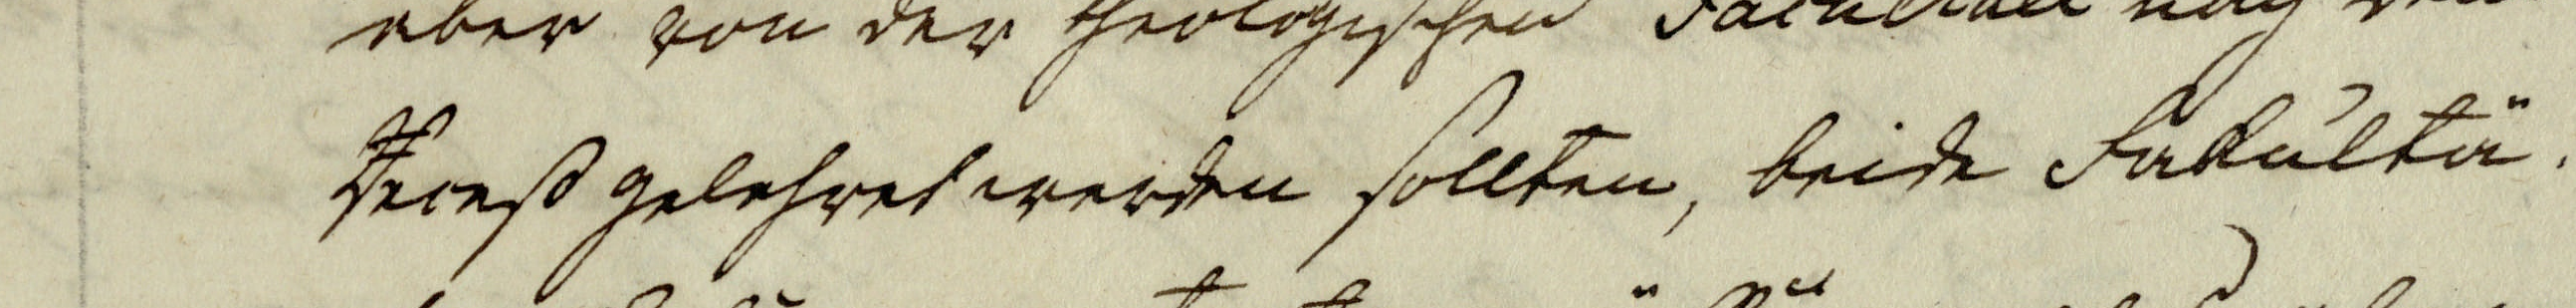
Receß gelehret werden sollten, beide Fakultä¬
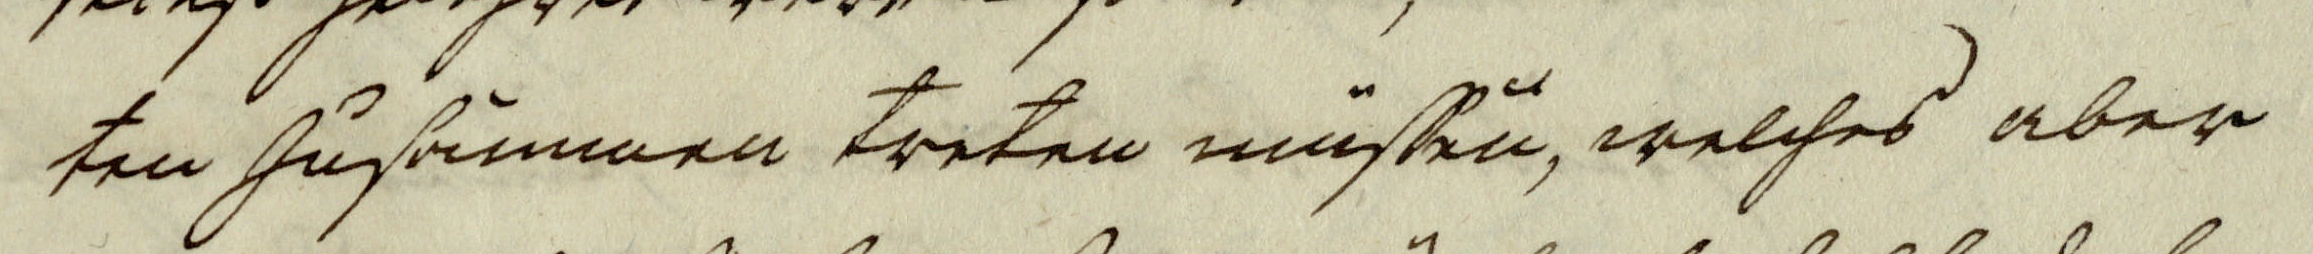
ten zusammen treten müssen, welches aber
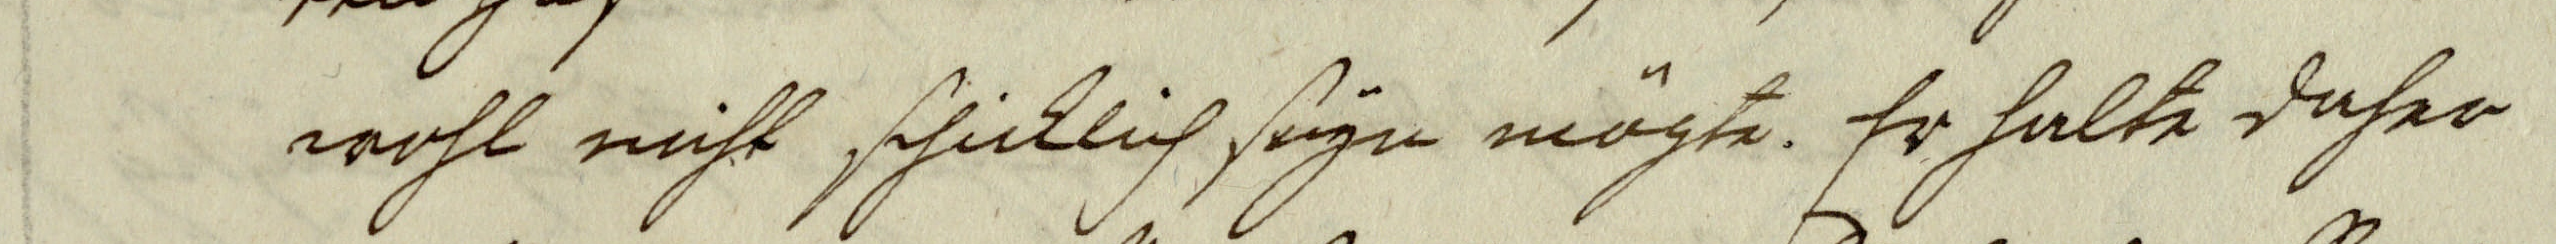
wohl nicht schicklich seÿn möchte. Er halte daher
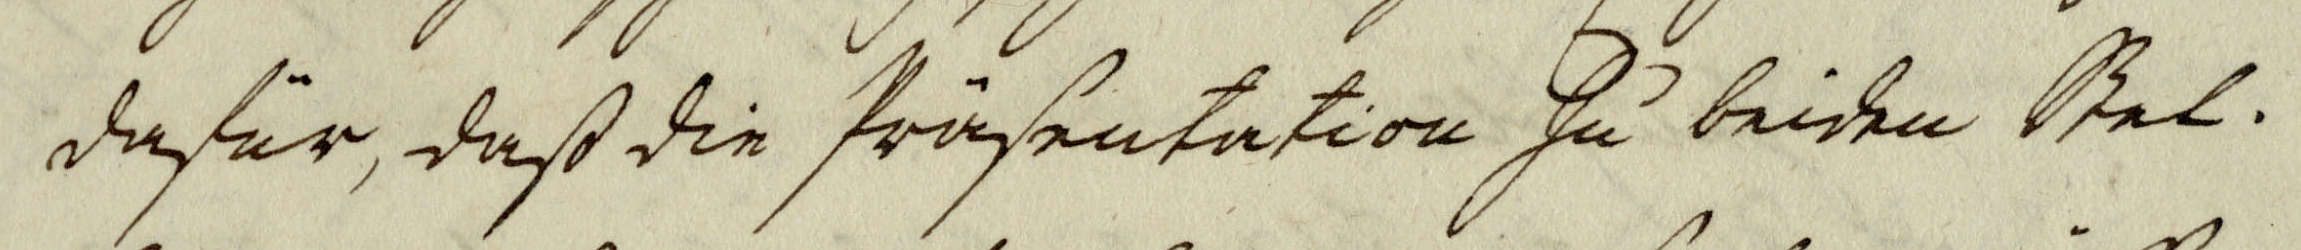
dafür, daß die Präsentation zu beiden Stel¬
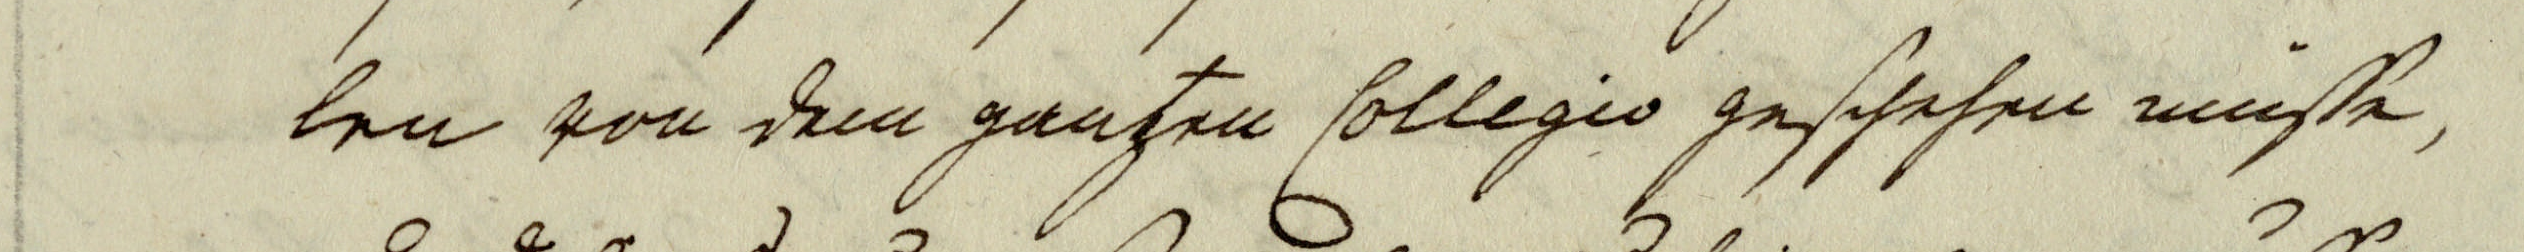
len von dem gantzen Collegio geschehen müsse,
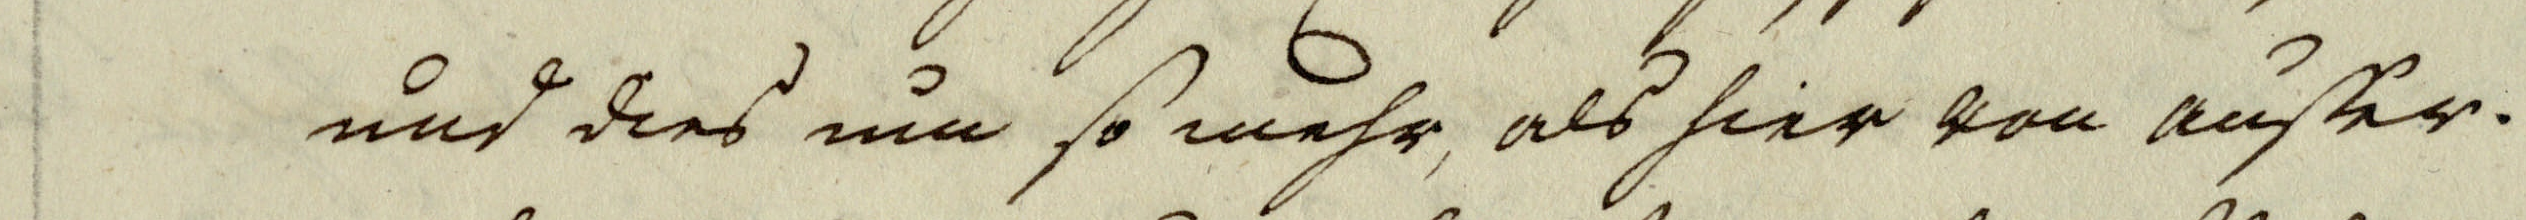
und dies um so mehr, als hier von ausser¬
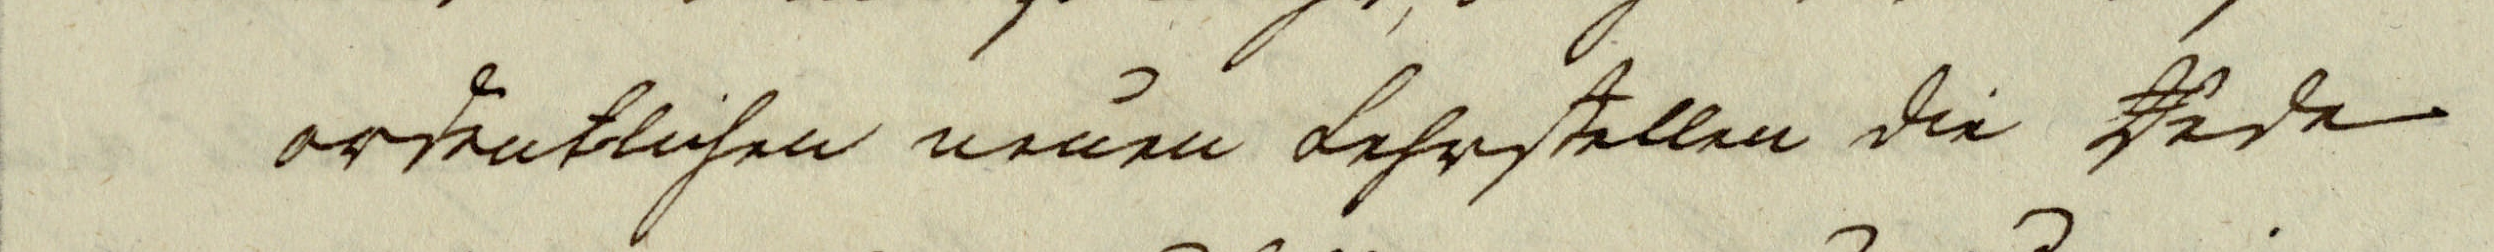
ordentlichen neuen Lehrstellen die Rede
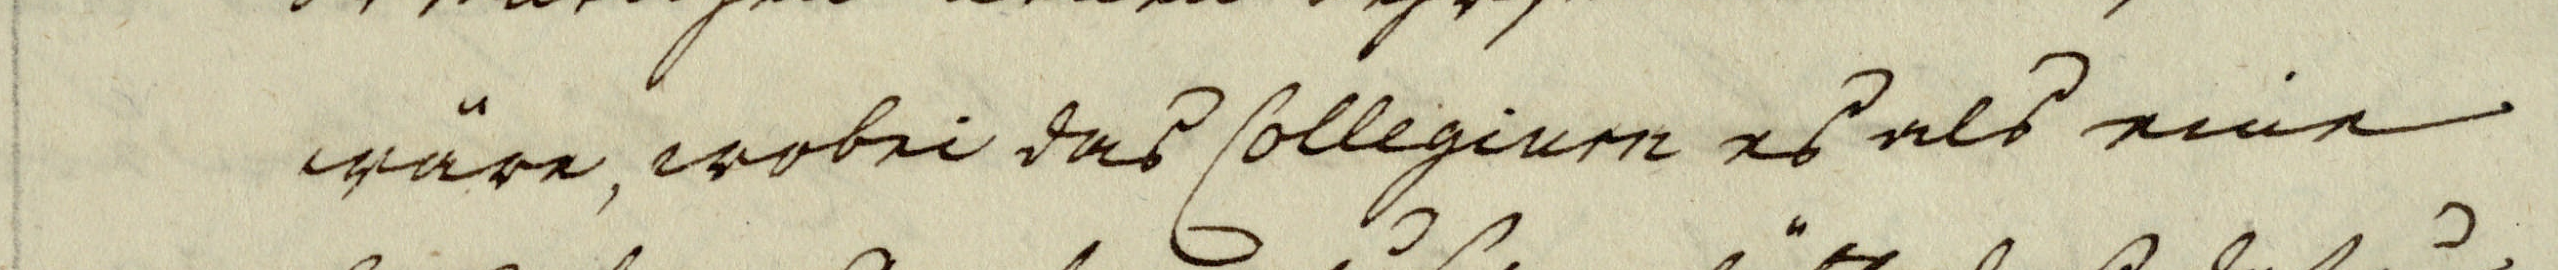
wäre, wobei das Collegium es als eine
